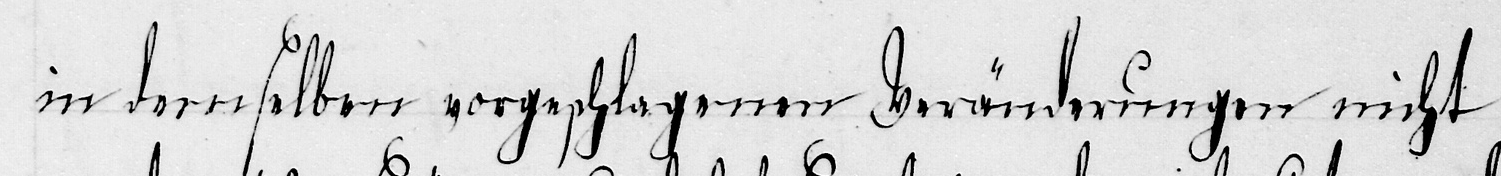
in demselben vorgeschlagenen Veränderungen nicht
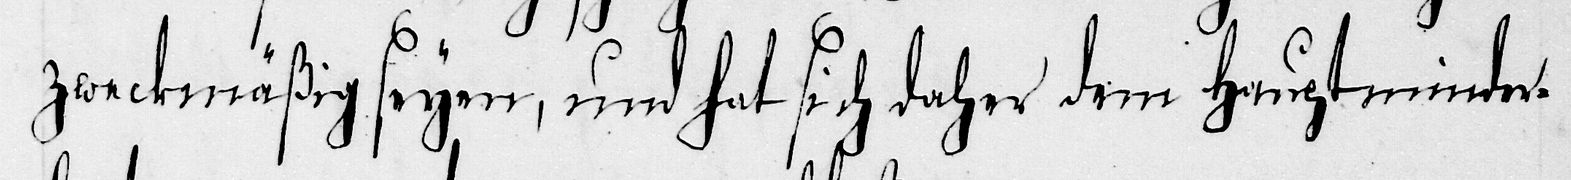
zweckmäßig seyen, und hat sich daher dem Hauptminder¬
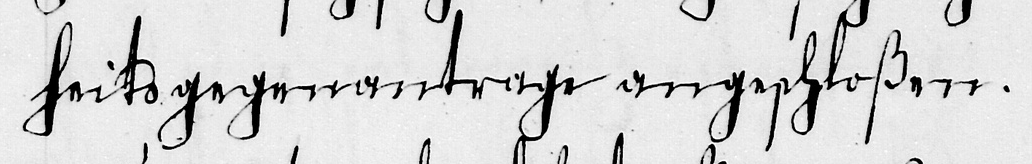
heitsgegenantrage angeschloßen.
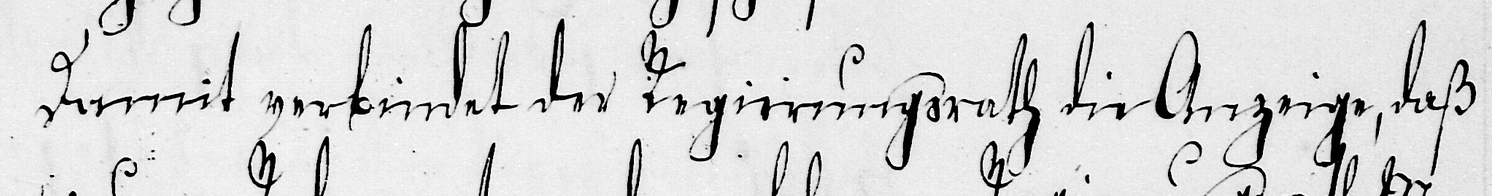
Damit verbindet der Regierungsrath die Anzeige, daß
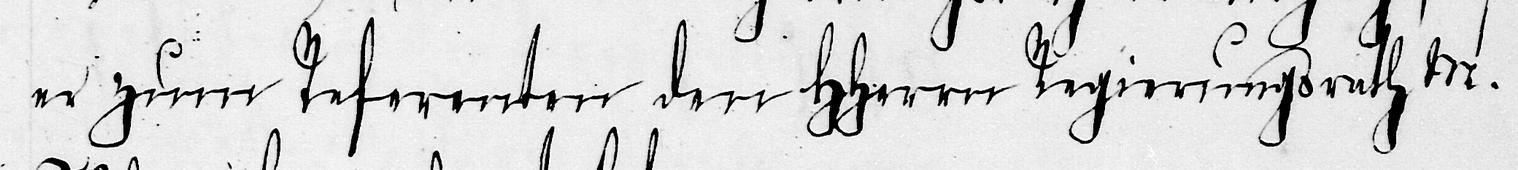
er zum Referenten den HHerrn Regierungsrath M.
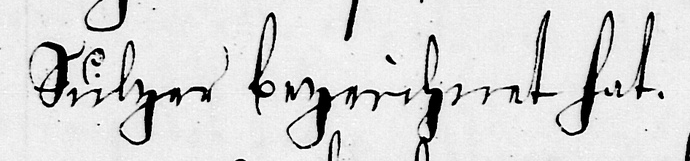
Sulzer bezeichnet hat.
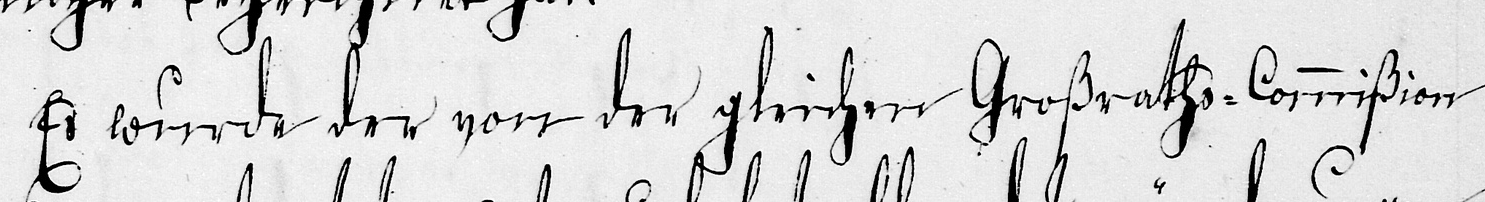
Es wurde der von der gleichen Großraths-Commißion
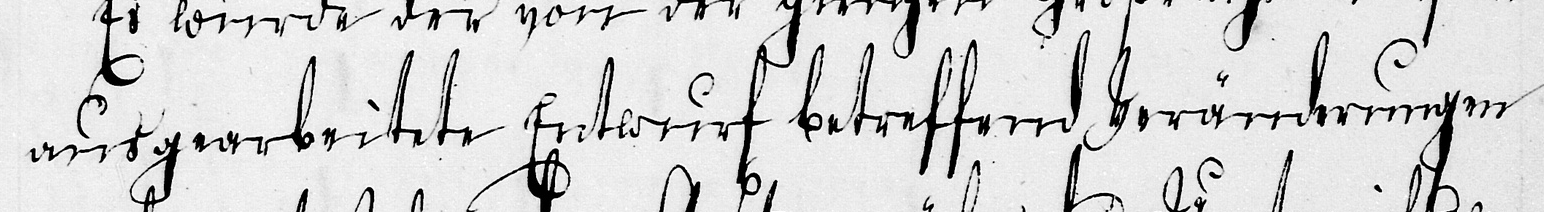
ausgearbeitete Entwurf betreffend Veränderungen
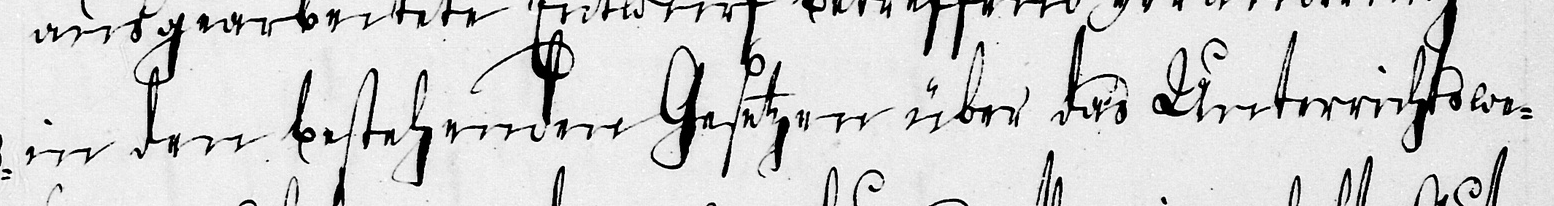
in den bestehenden Gesetzen über das Unterrichtswe¬
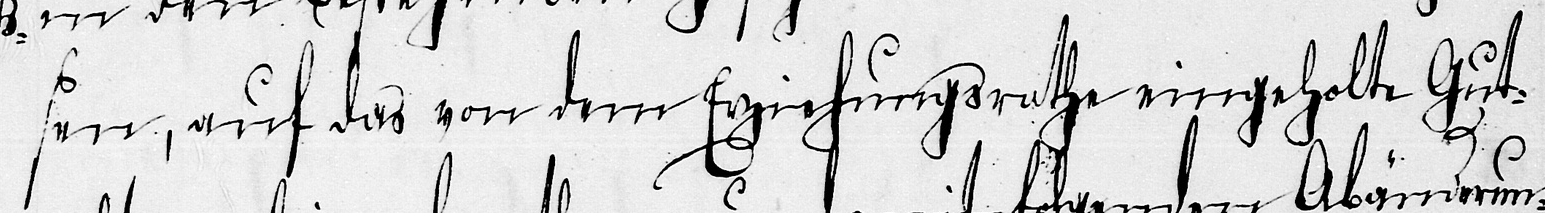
sen, auf das von dem Erziehungsrathe eingeholte Gut¬
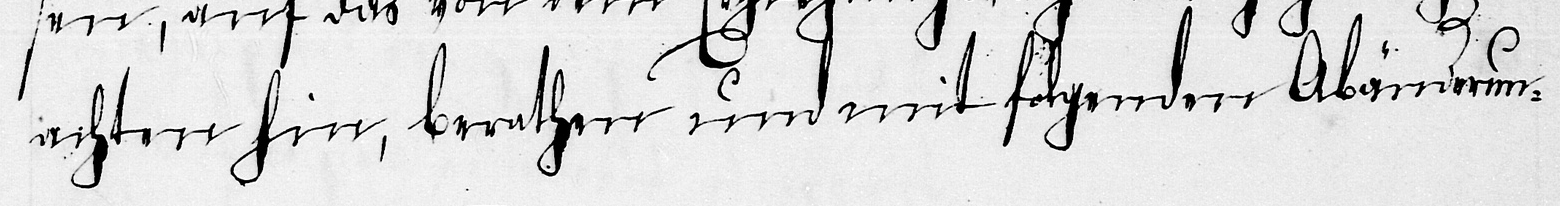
achten hin, berathen und mit folgenden Abänderun¬
